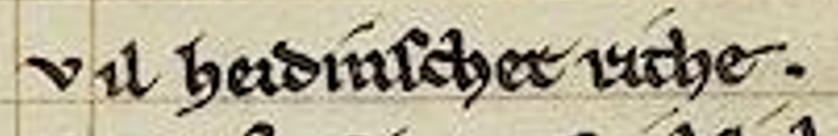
Vil heidinſcher riche.
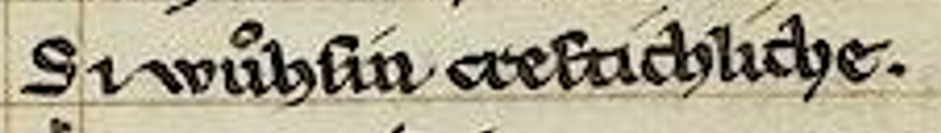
Si wu°ohſin creftichliche.
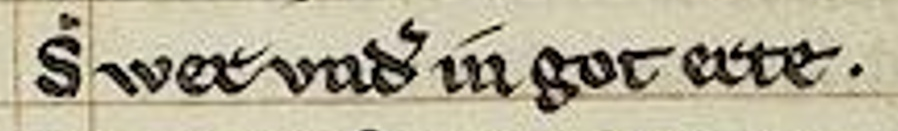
Swer vnd(er) in got erte.
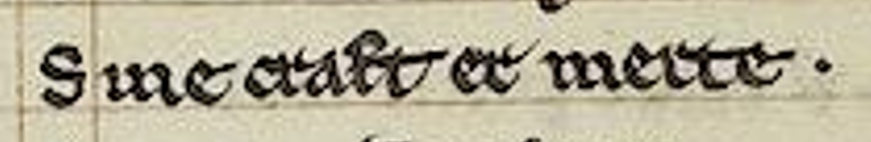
Sine craft er merte.
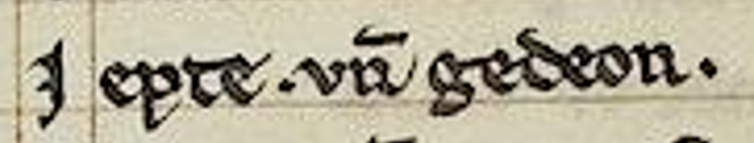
Jepte. vn(d) gedeon.
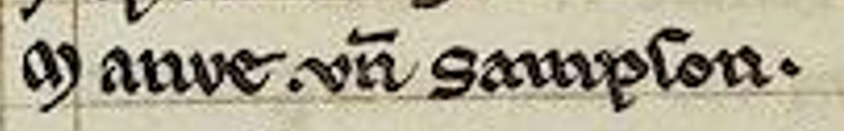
Manue. vn(d) sampſon.
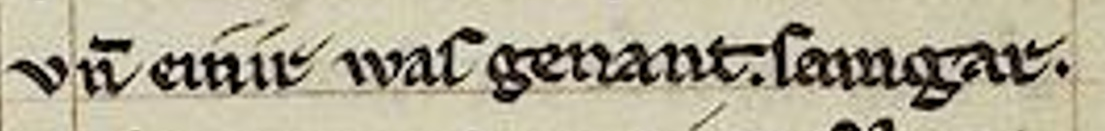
Vn(d) einir waſ genant. ſamgar.
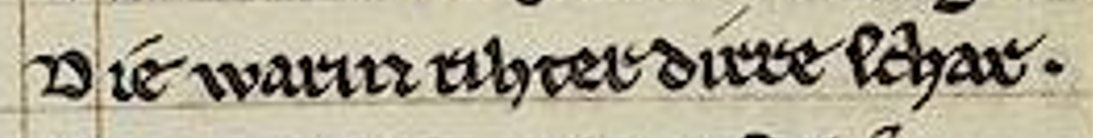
Die warin rihter dirre ſchar.
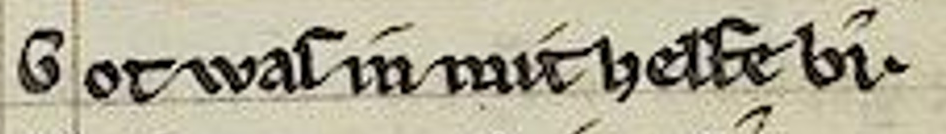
Got waſ in mit helfe bi.
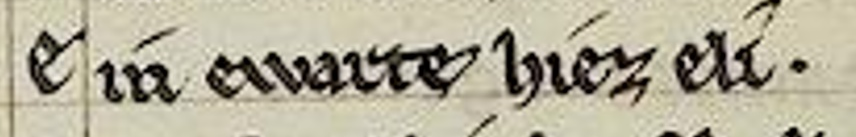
Ein ewarte hiez eli.
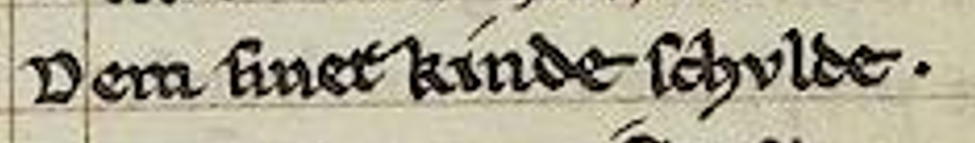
Dem ſiner kinde ſchvlde.
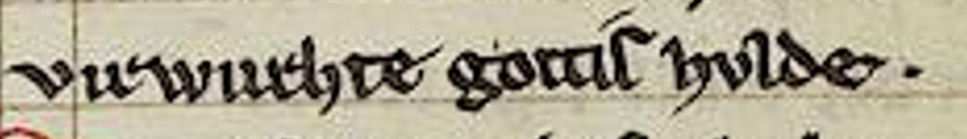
Virwurhte gottiſ hvlde.
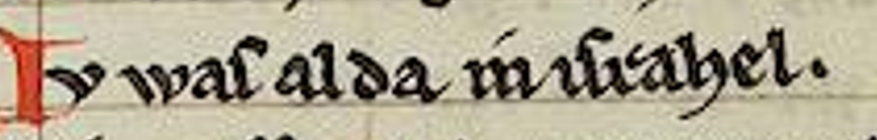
*Nv waſ alda in iſrahel.
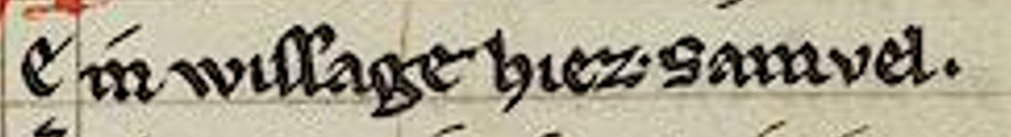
Ein wiſſage hiez samvel.
